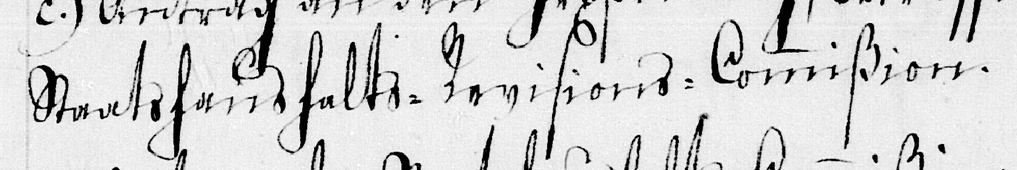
Staatshaushalts-Revisions-Commißion.
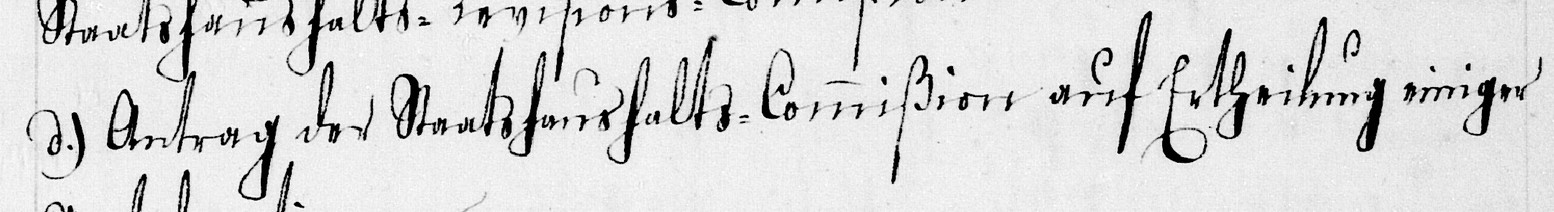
d.) Antrag der Staatshaushalts-Commißion auf Ertheilung einiger
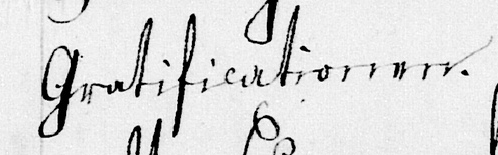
Gratificationen.
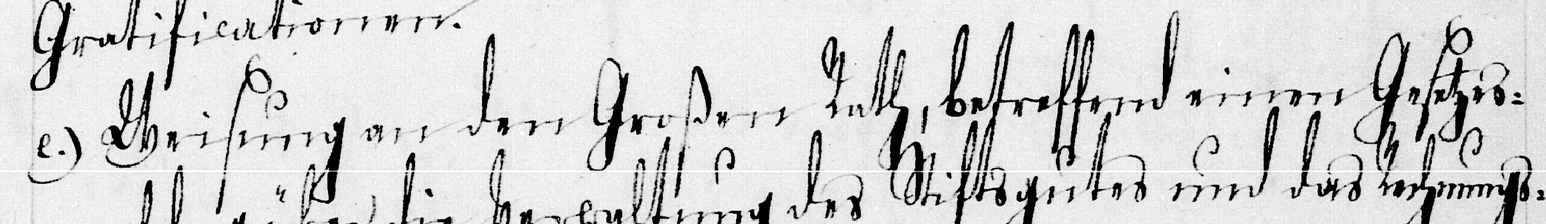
e.) Weisung an den Großen Rath, betreffend einen Gesetz¬
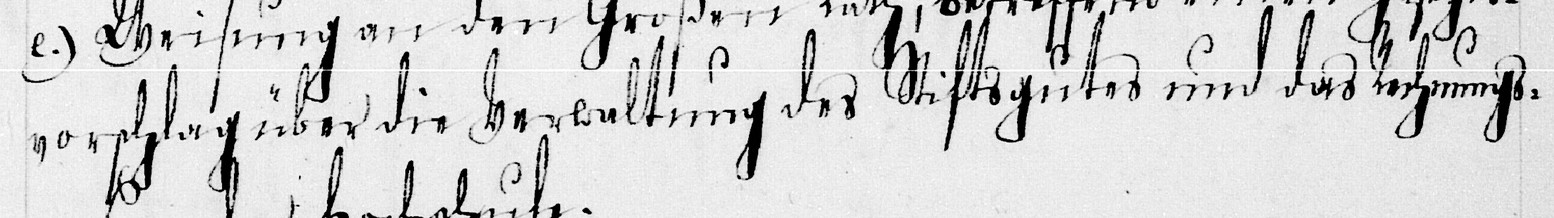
vorschlag über die Verwaltung des Stiftsgutes und das Rechnung¬
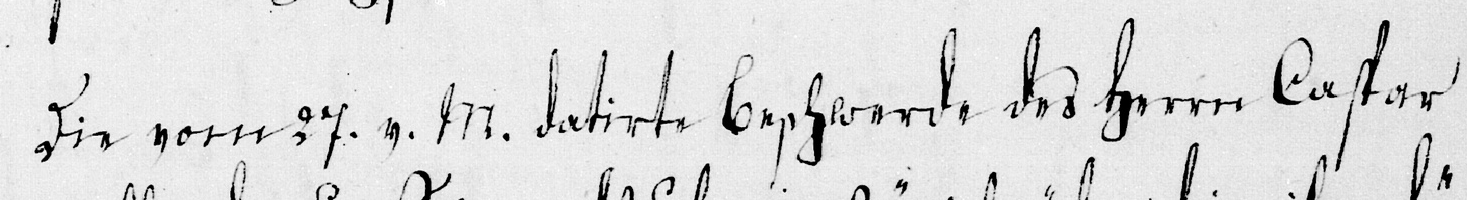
Die vom 27. v. M. datirte Beschwerde des Herrn Caspar
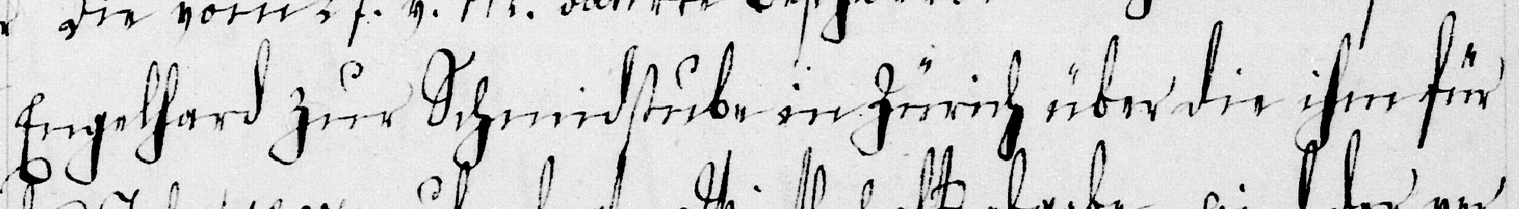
Engelhard zur Schmidstube in Zürich über die ihm für
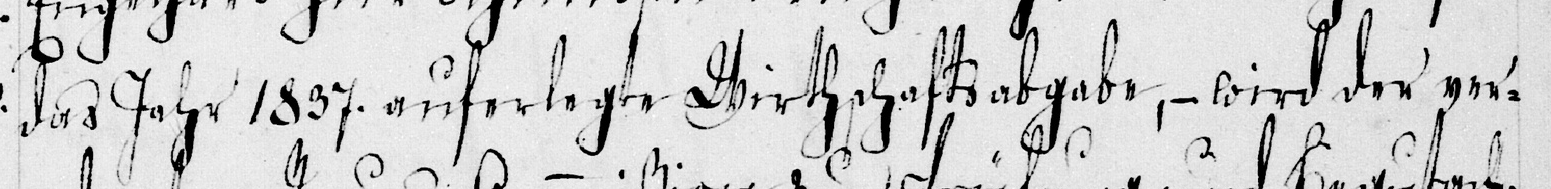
das Jahr 1837. auferlegte Wirthschaftsabgabe, – wird der ver¬
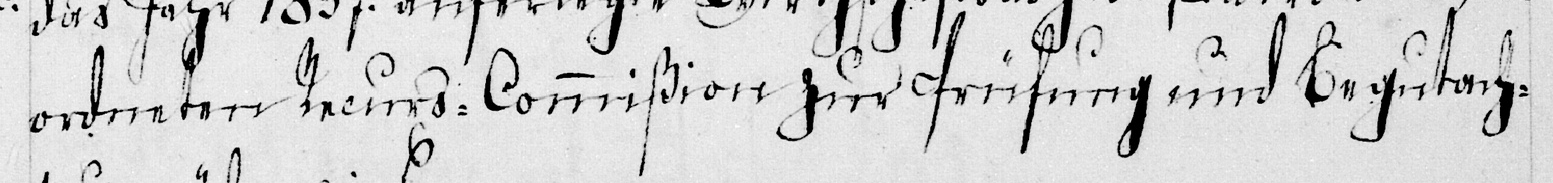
ordneten Recurs-Commißion zur Prüfung und Begutach¬
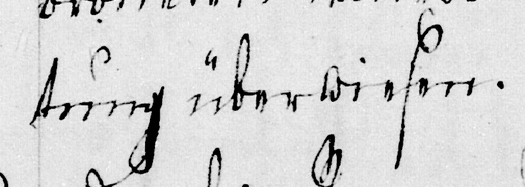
tung überwiesen.
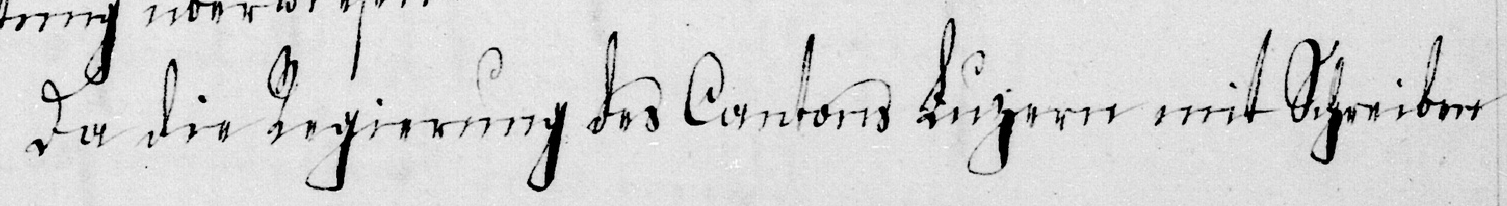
Da die Regierung des Cantons Luzern mit Schreiben
